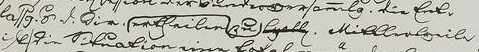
lassg. aus d. Dir. zu ertheilen wollen. Mittlerweile
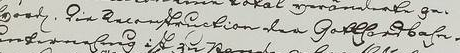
worden. Die Reconstruction der Gotthardbahn-
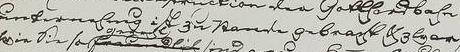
unternehmung ist zu Stande gebracht & zwar,
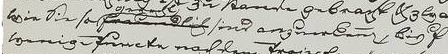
wie Sie so freundlichgerecht sind anzuerkennen, bis auf
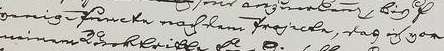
wenige Puncte nach dem Projecte, das ich vor
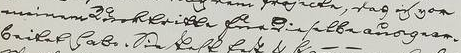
meinem Rücktritte für dieselbe ausgear-
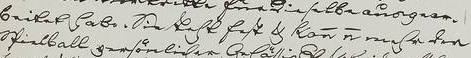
beitet habe. Sie steht fest & kann nicht mehr der
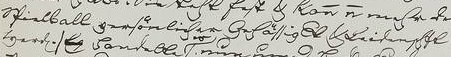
Spielball persönlicher Gehässigkt & Leidenschft
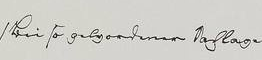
Bei so gewordener Sachlage
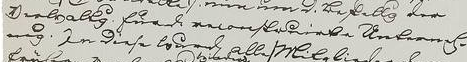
Verwaltung für d. reconstruirte Unterneh-
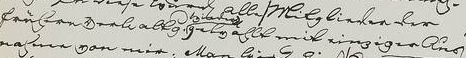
frühern Verwaltg. wieder gewählt mit einziger Aus-
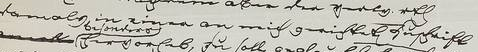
damals in einer an mich gerichteten Zuschrift
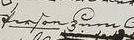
Person zum
